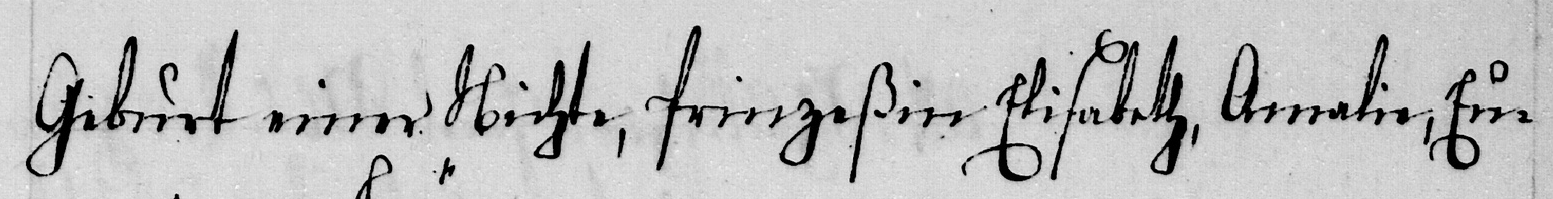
Geburt einer Nichte, Prinzeßin Elisabeth, Amalie, Eu¬
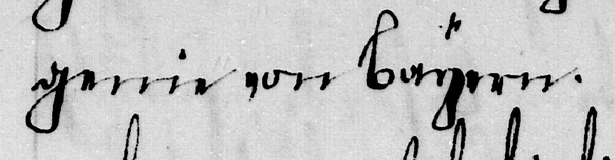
genie von Bayern.
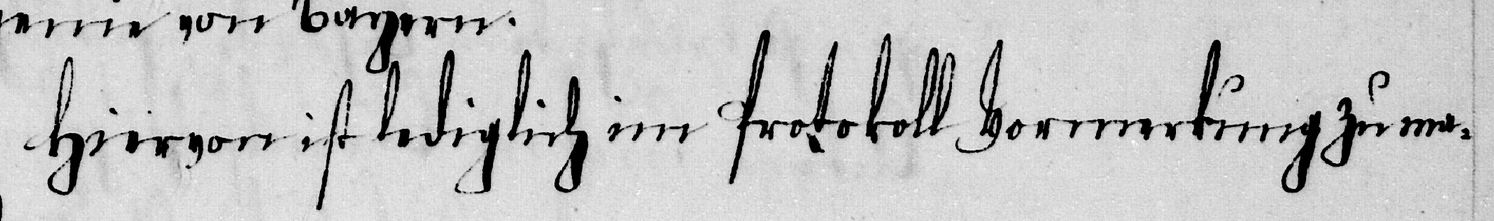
Hiervon ist lediglich im Protokoll Vormerkung zu ma¬
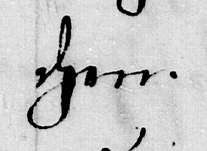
chen.
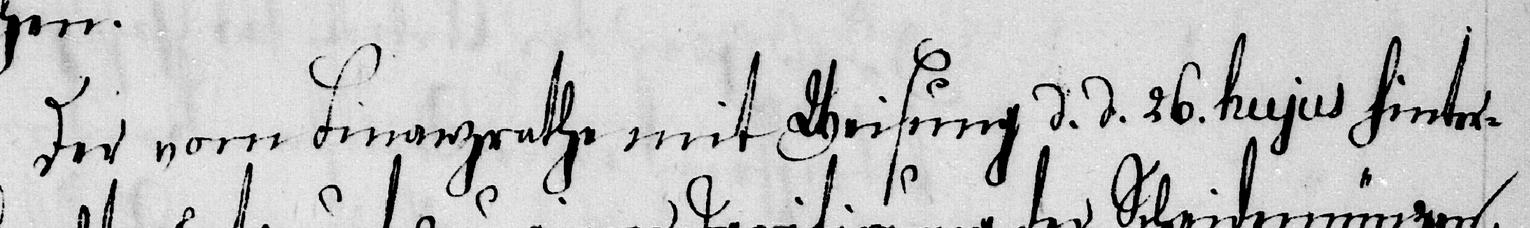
Der vom Finanzrathe mit Weisung d. d. 26. hujus hinter¬
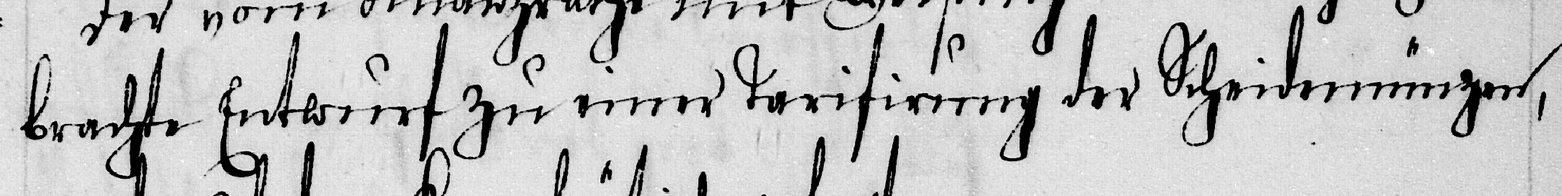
brachte Entwurf zu einer Tarifirung der Scheidemünzen
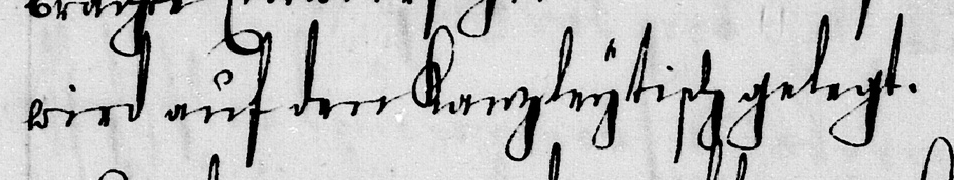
wird auf den Kanzleytisch gelegt.
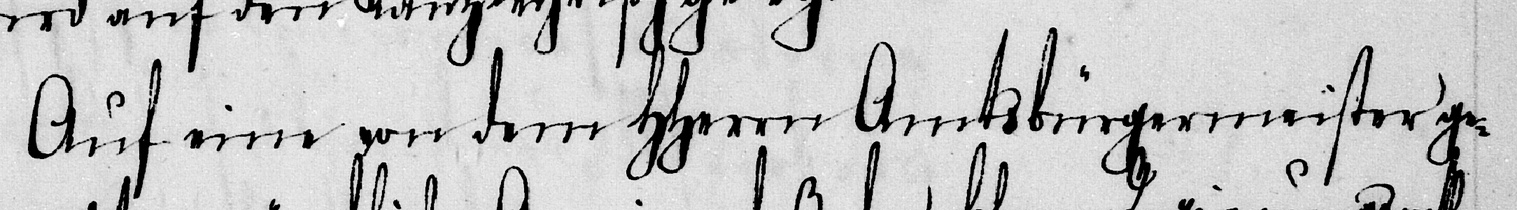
Auf eine von dem HHerrn Amtsbürgermeister ge¬
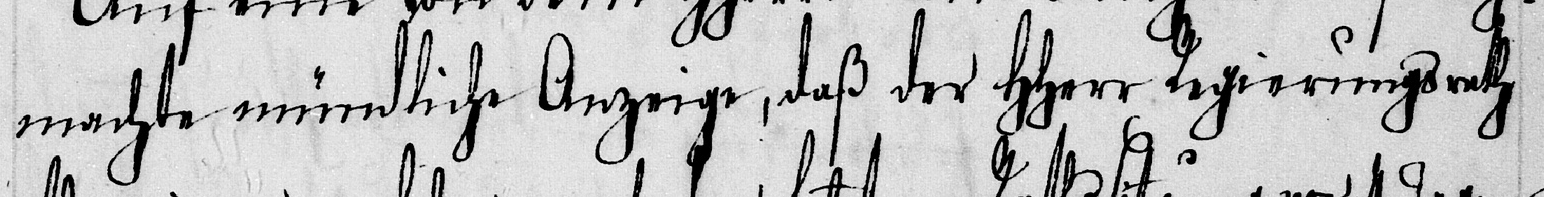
machte mündliche Anzeige, daß der HHerr Regierungsrath
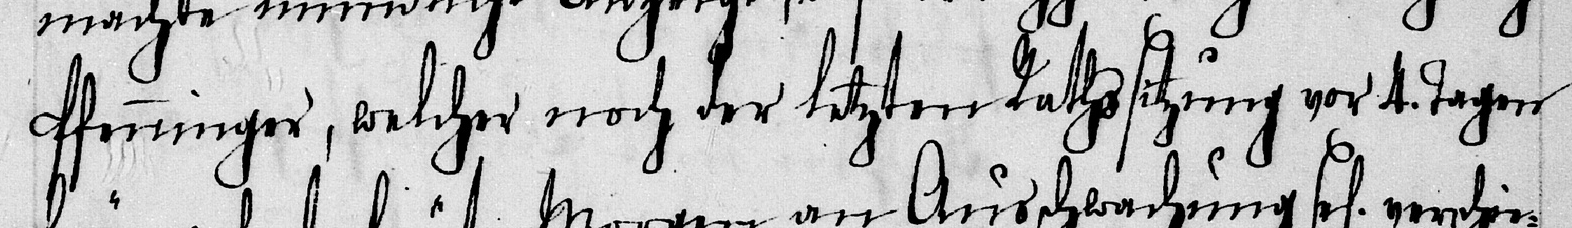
Pfenninger, welcher noch der letzten Rathssitzung vor 4. Tagen
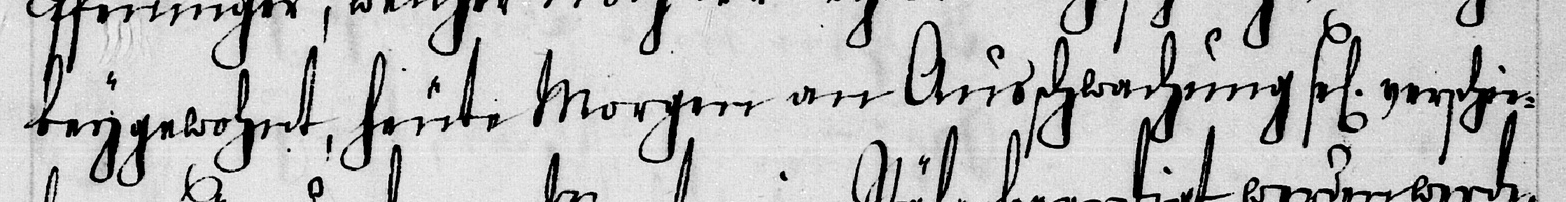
beygewohnt, heute Morgen an Ausschwachung sel. verschie¬
